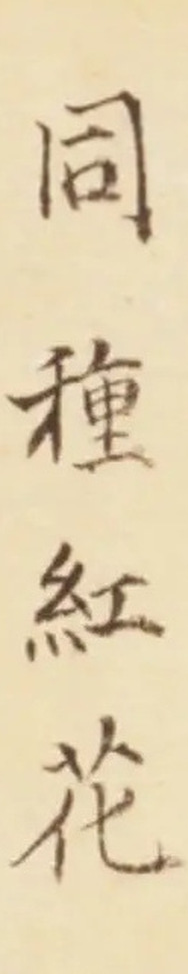同種紅花
